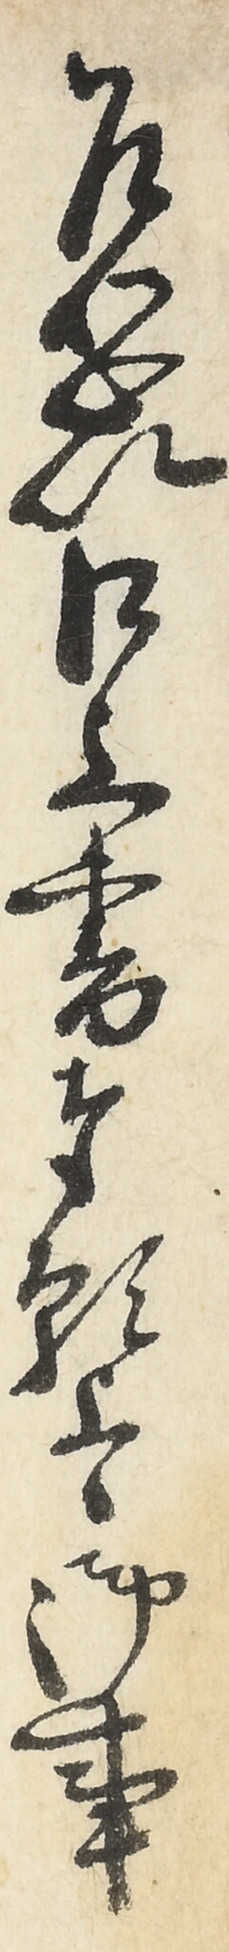乍恐以口上書奉願上候御事
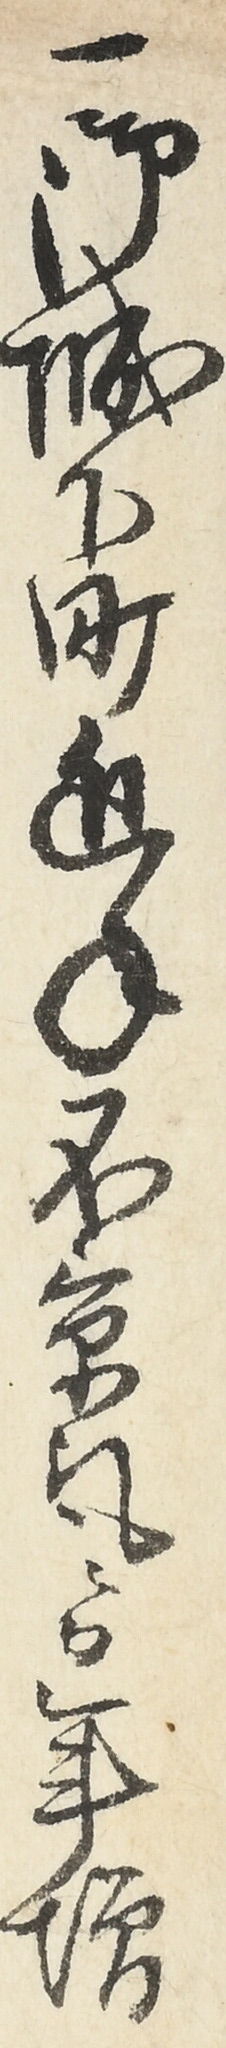一御城下町近年不景気ニ而年増
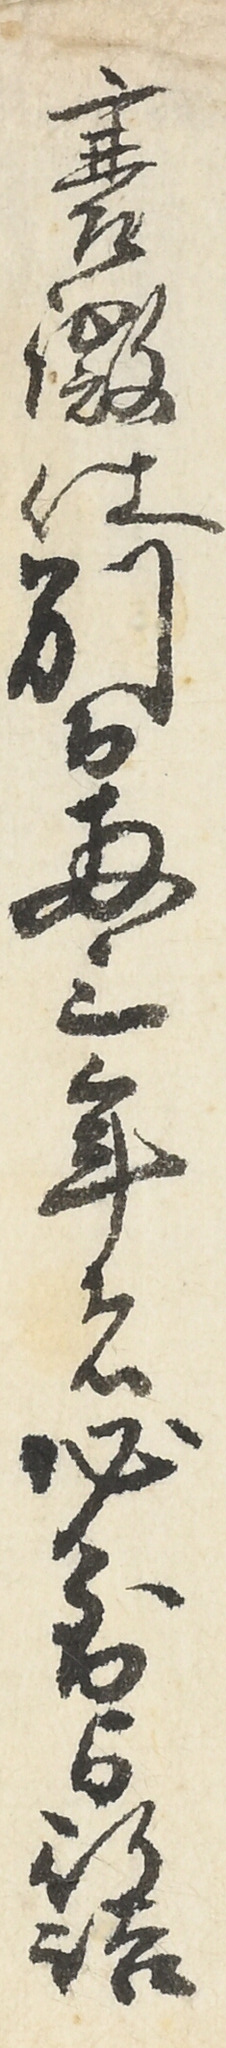衰微仕別而両三年は必至と行詰
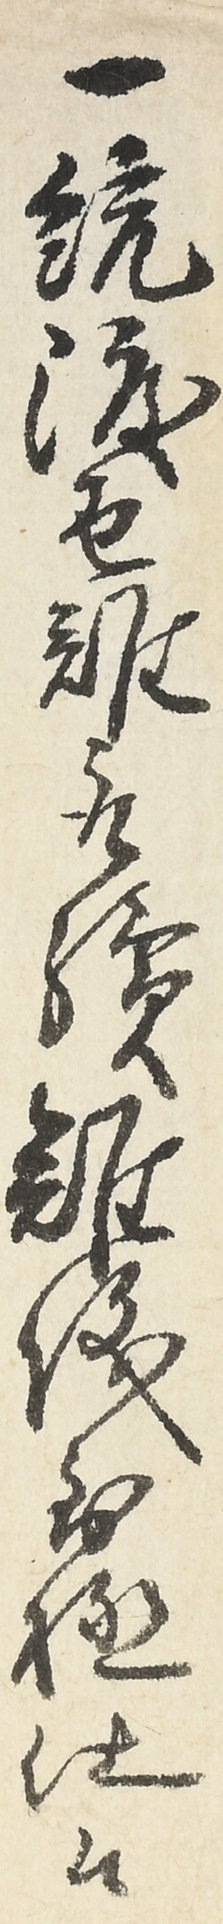一統渡世難取続難儀取極仕候
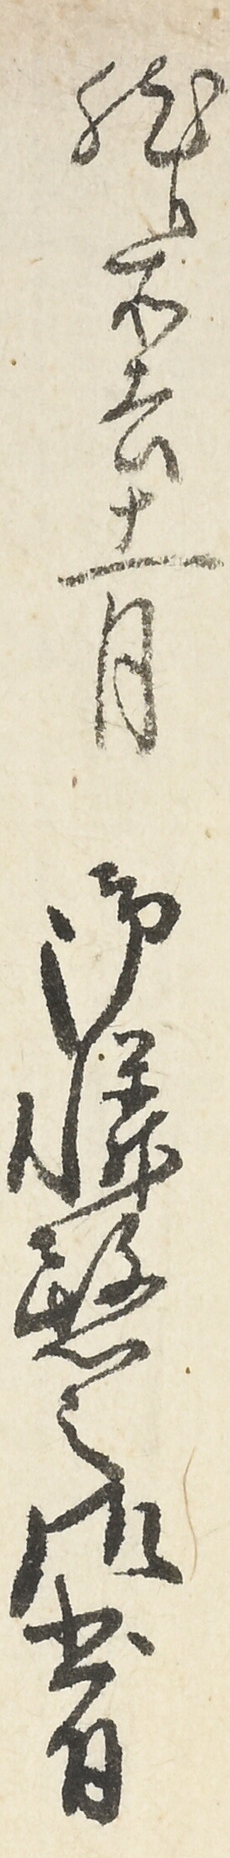然ル所去十一月御憐愍之御書付
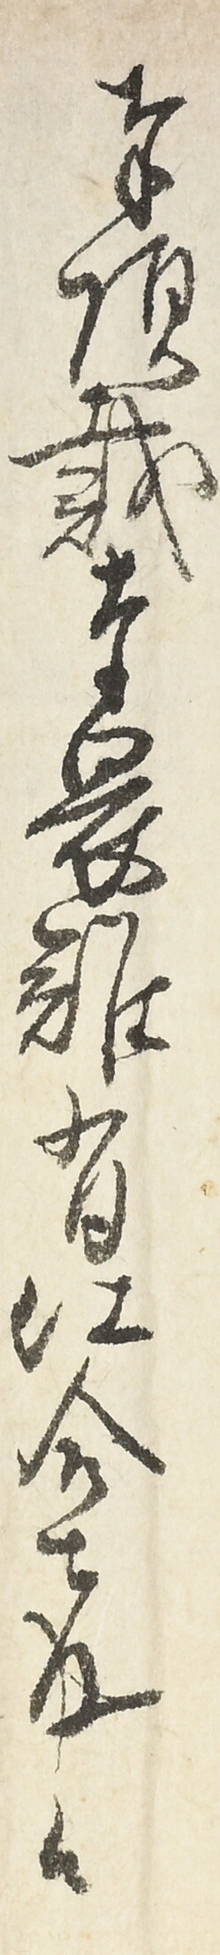奉頂戴奉畏難有仕合存候
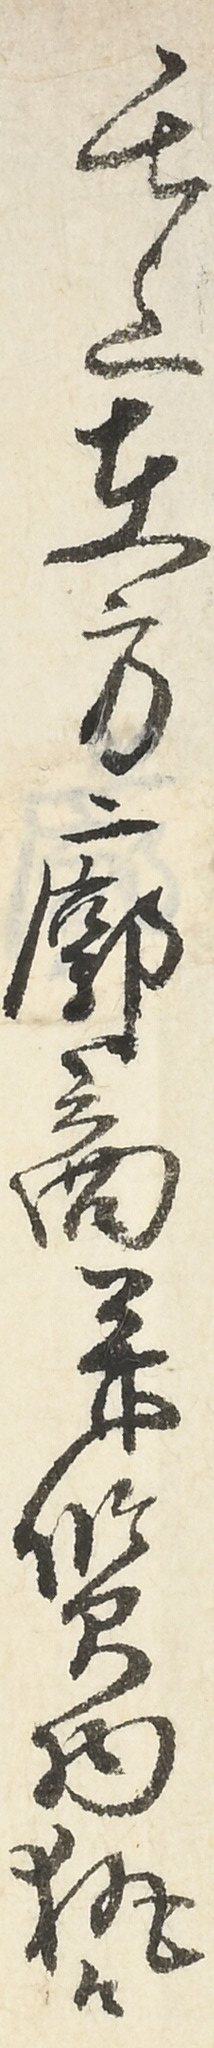其上在方廓商并質物執候
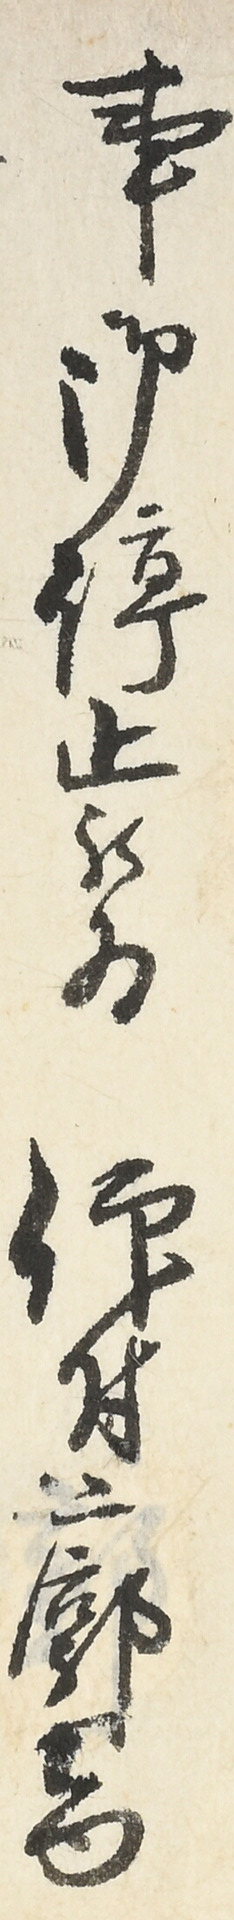事御停止被為仰付廓商
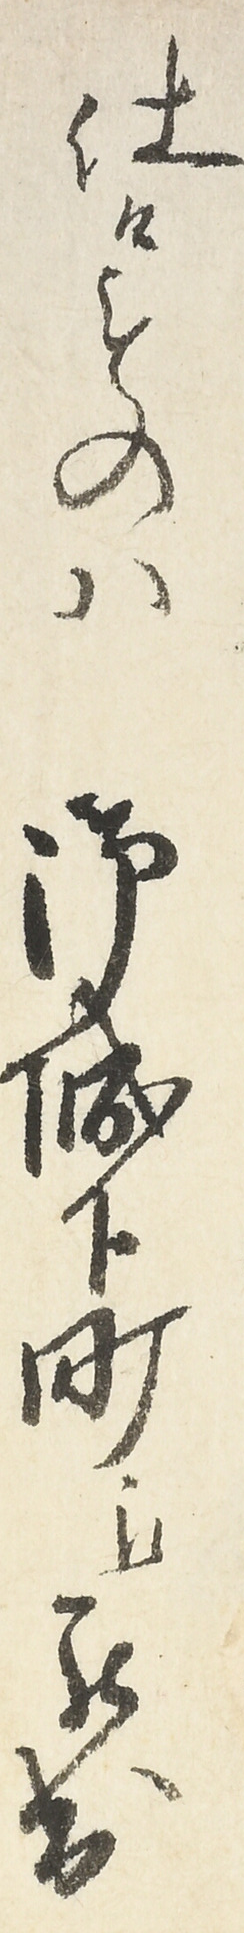仕候ものハ御城下町江罷出
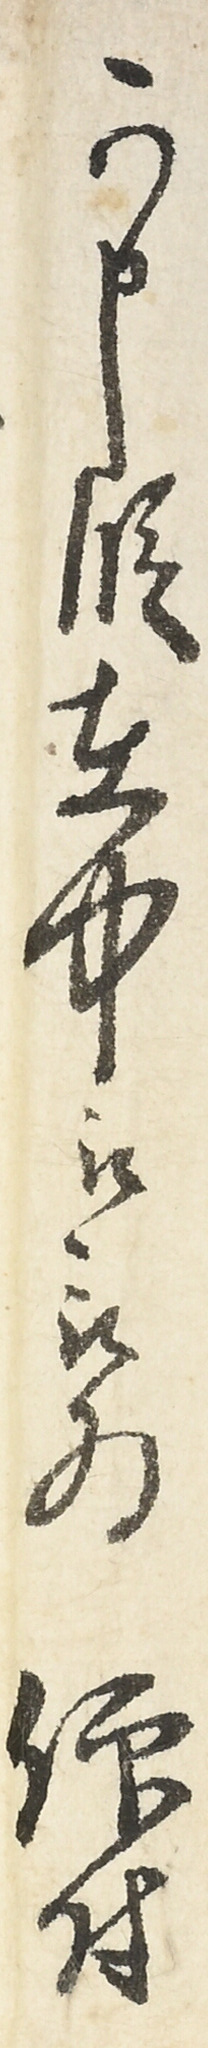可申段在中江被為仰付
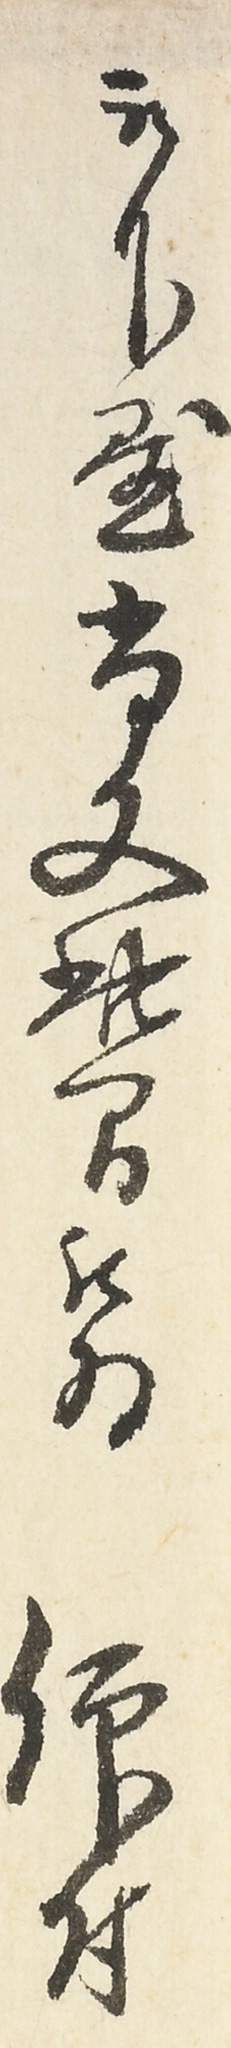被下置尚又此間被為仰付
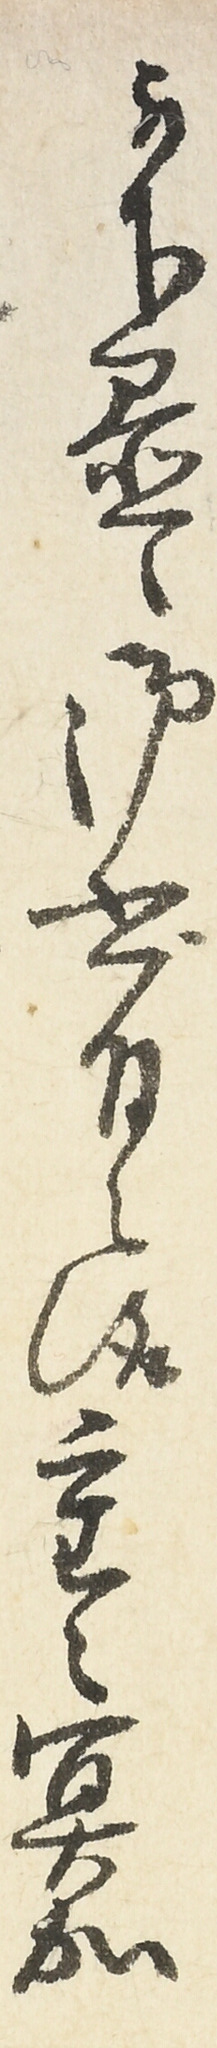被下置候御書付之趣重々冥加
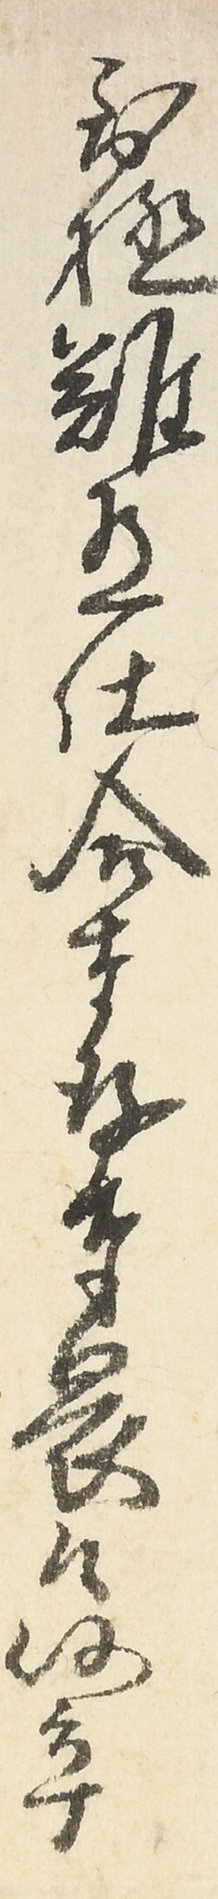至極難有仕合奉存奉畏候何卒
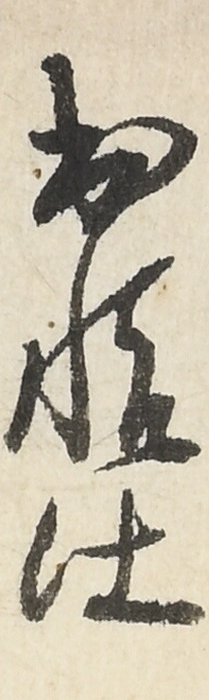出情仕
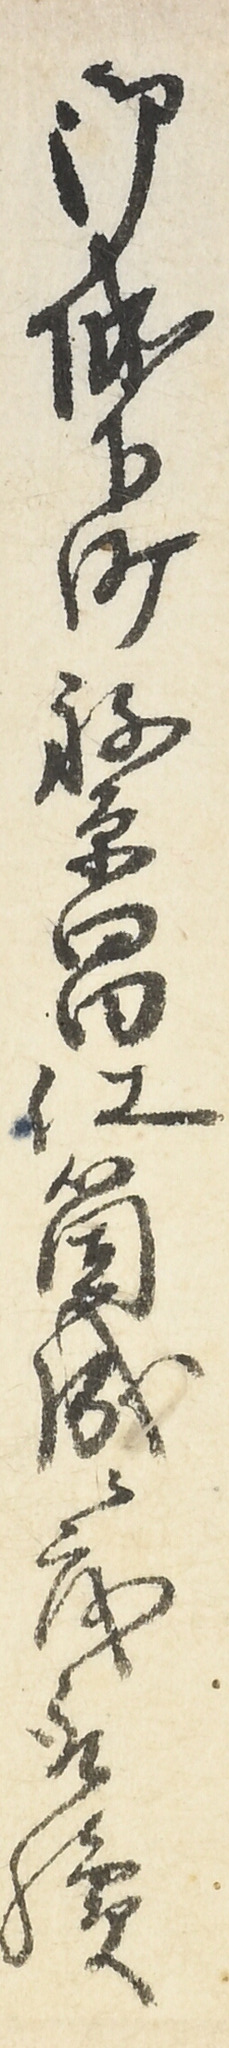御城下町繁昌仕箇成ニも取続
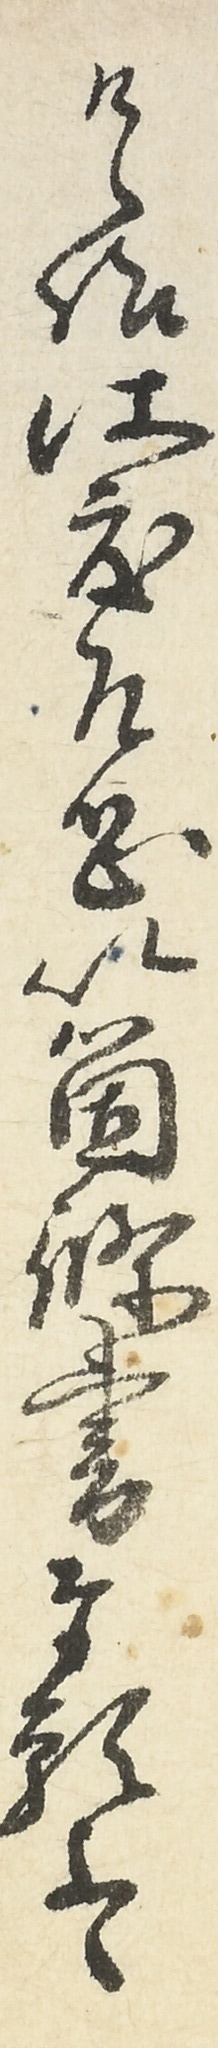候之様仕度乍恐以箇條書奉願上候
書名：乍恐以口上書奉願上候御事
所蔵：伊那市立高遠町図書館・合同会社AMANE
